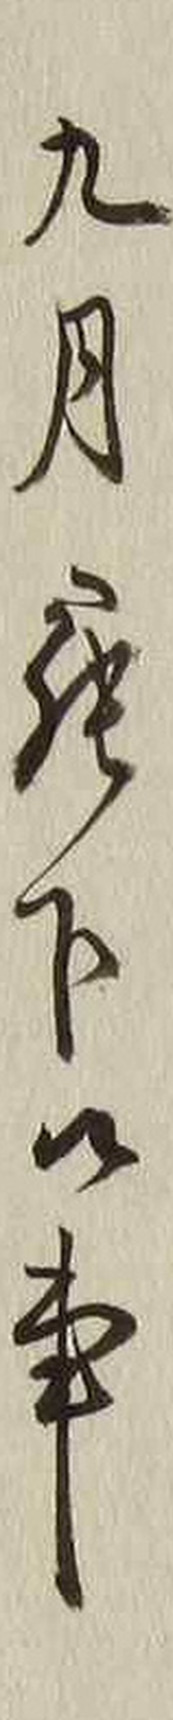九月罷下候事
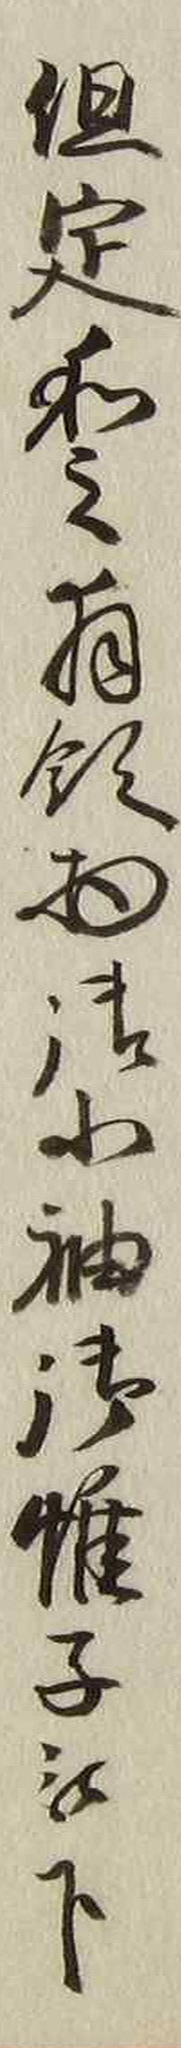但定和之拝領物御小袖御帷子被下
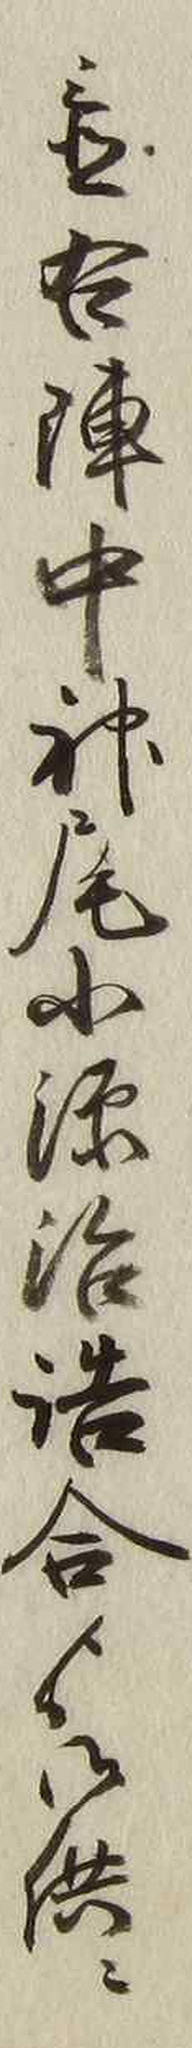置右陣中神尾小源治詰合ゟ御供ニ
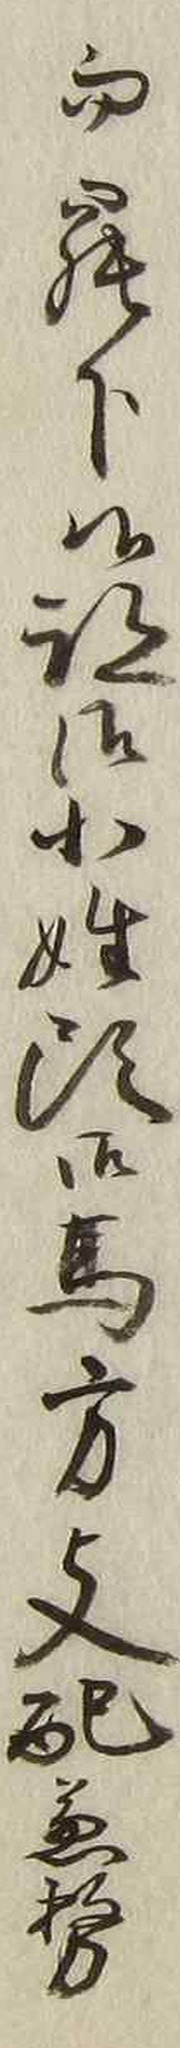而罷下候跡御小姓頭御馬方支配兼務
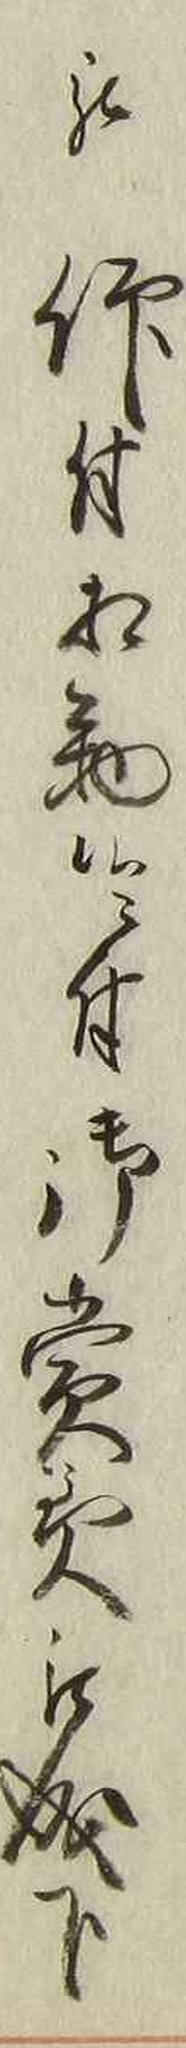被仰付相勤候ニ付御賞美被成下

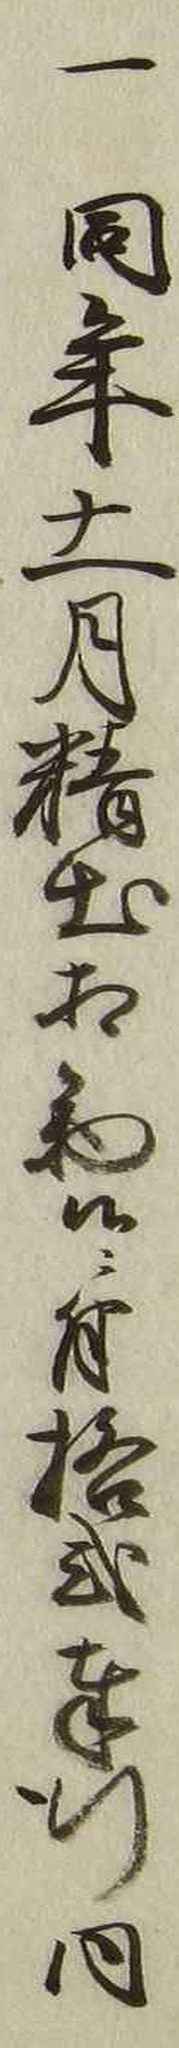一同年十一月精出相勤候ニ付格弐奉行同
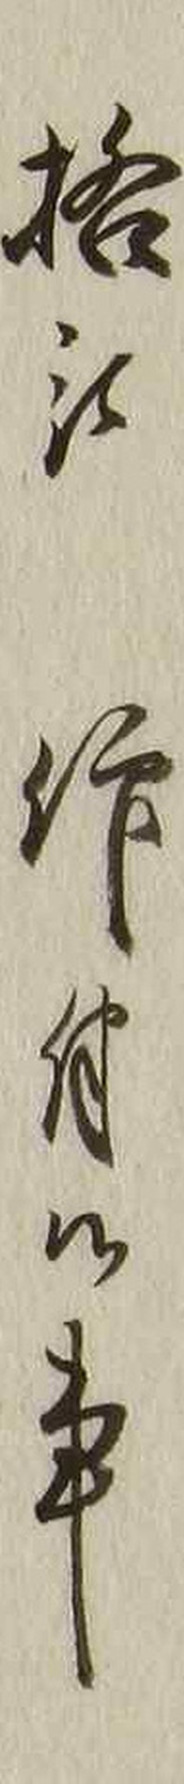格被仰付候事
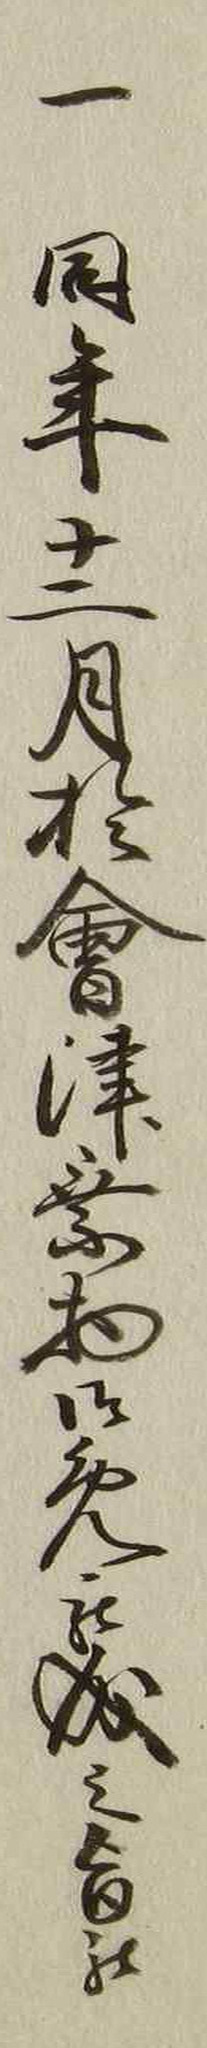一同年十二月於会津乗物御免被成之旨被
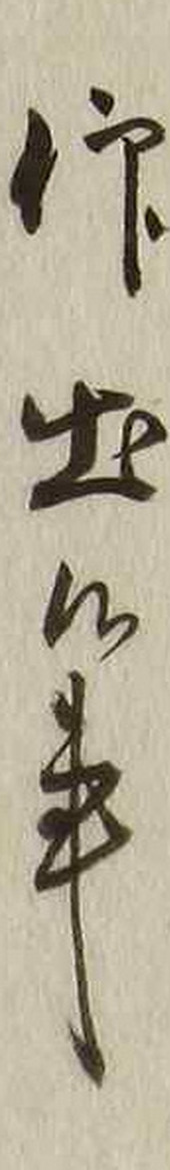仰出候事
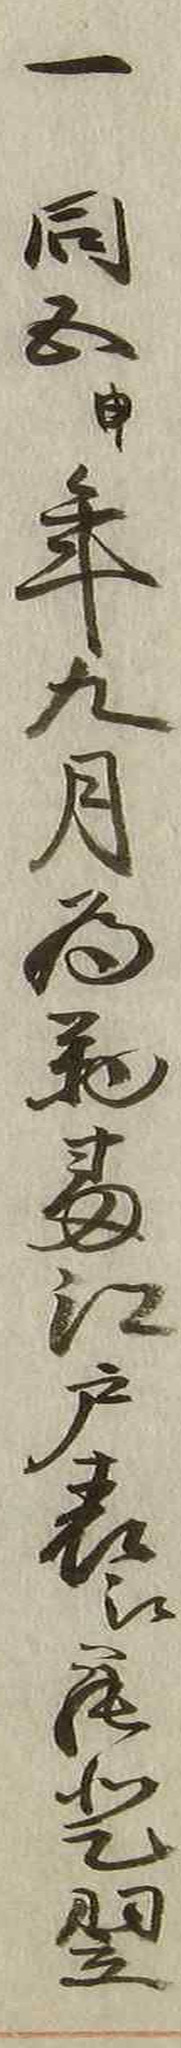一同五申年九月為勤番江戸表江罷登翌
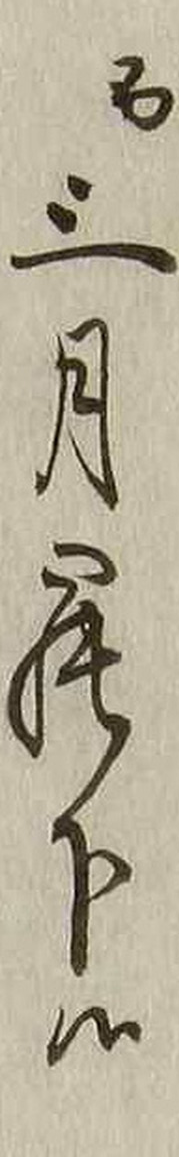酉三月罷下候
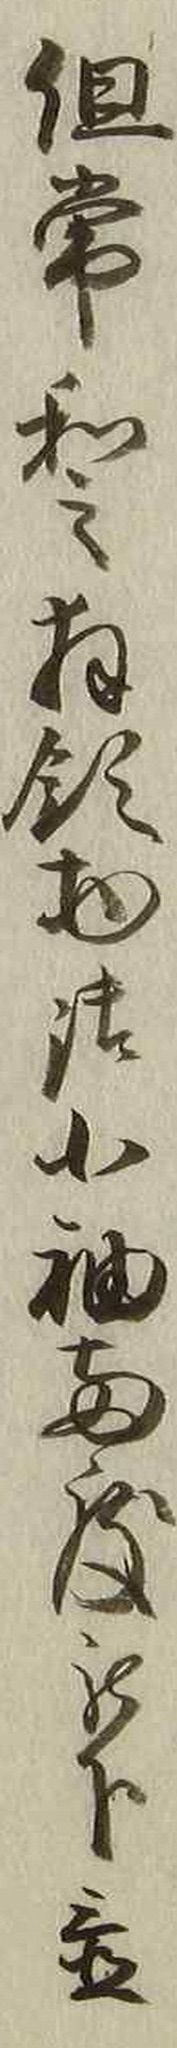但常和之拝領物御小袖両度被下置
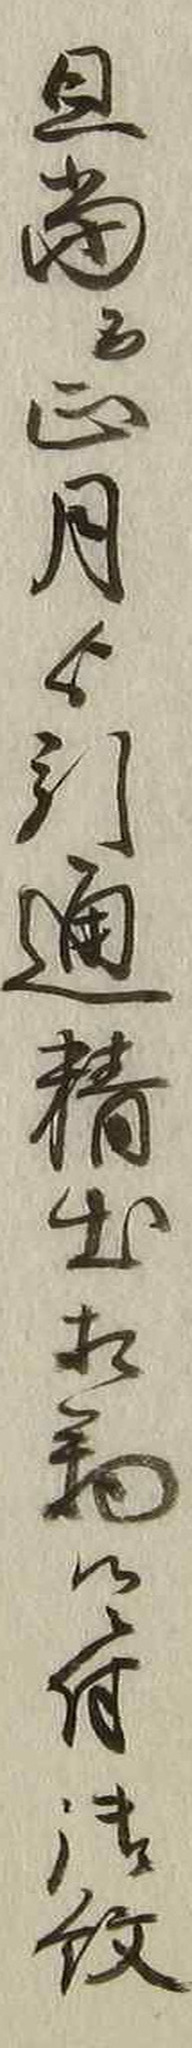且当酉正月ゟ引通精出相勤候ニ付御紋
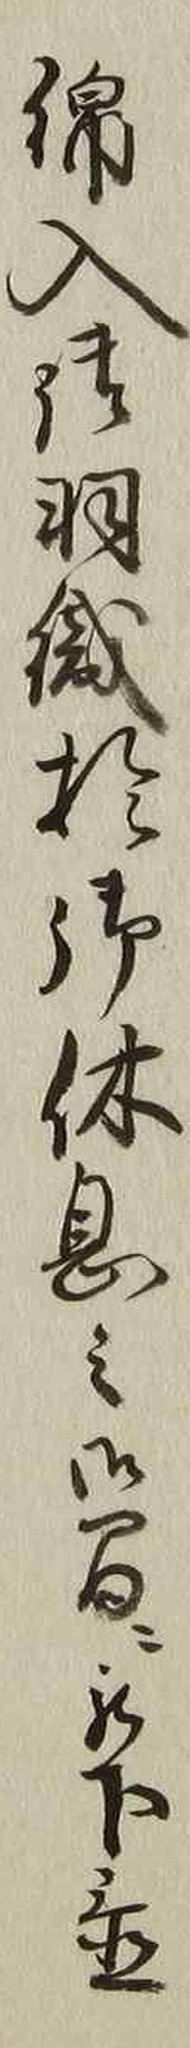綿入御羽織於御休息之御間ニ被下置
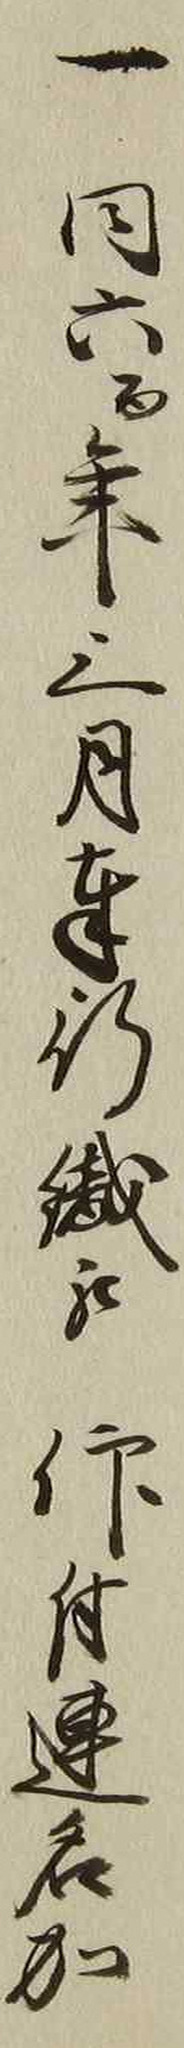一同六酉年三月奉行職被仰付連名加
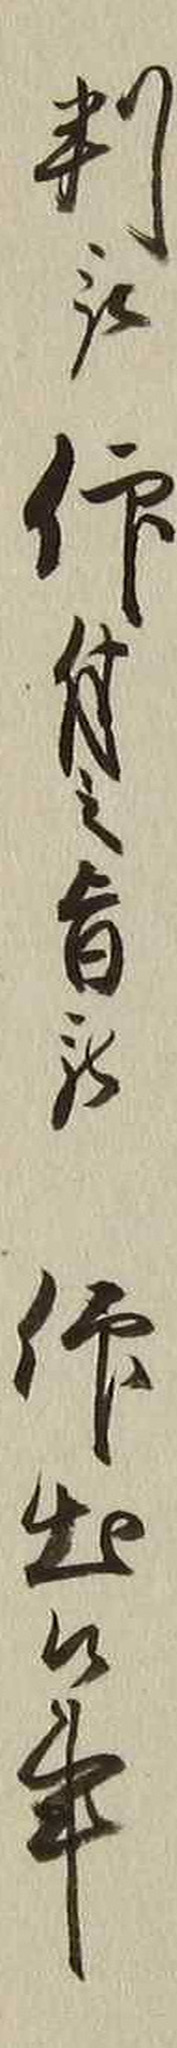判被仰付之旨被仰出候事
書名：諸士系譜　巻之15　い之部15
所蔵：会津若松市立会津図書館
